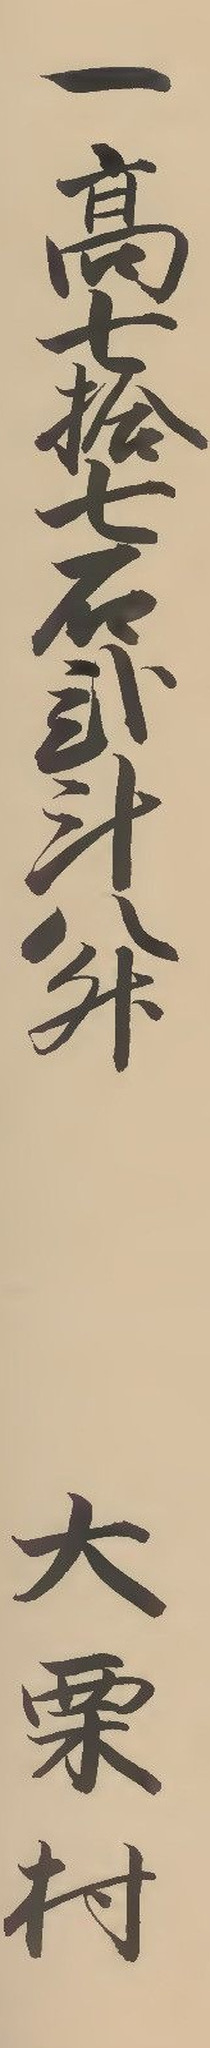一高七拾七石弐斗八升大栗村
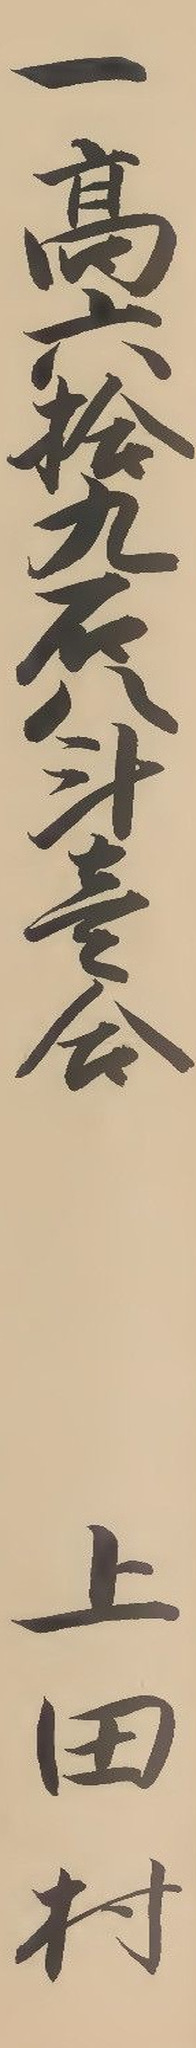一高六拾九石八斗壱合上田村
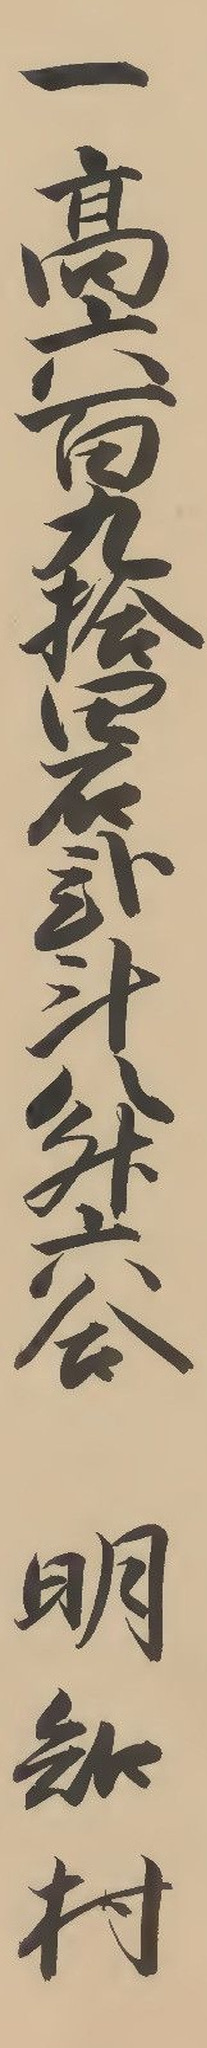一高六百九拾四石弐斗八升六合明知村
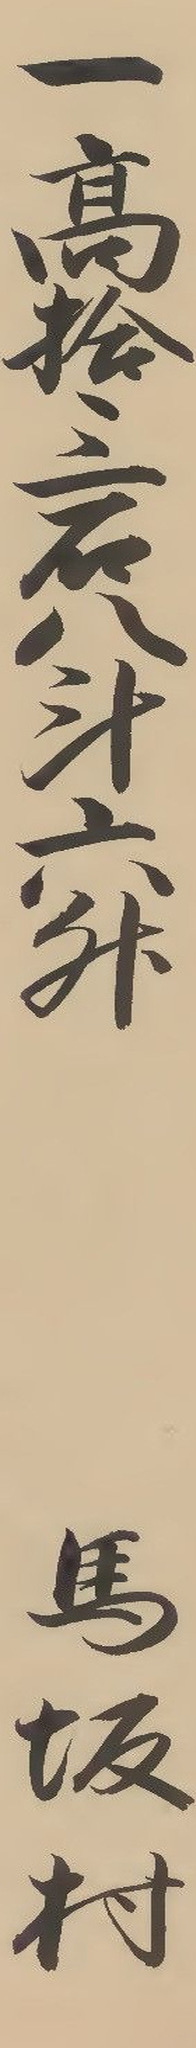一高拾三石八斗六升馬坂村
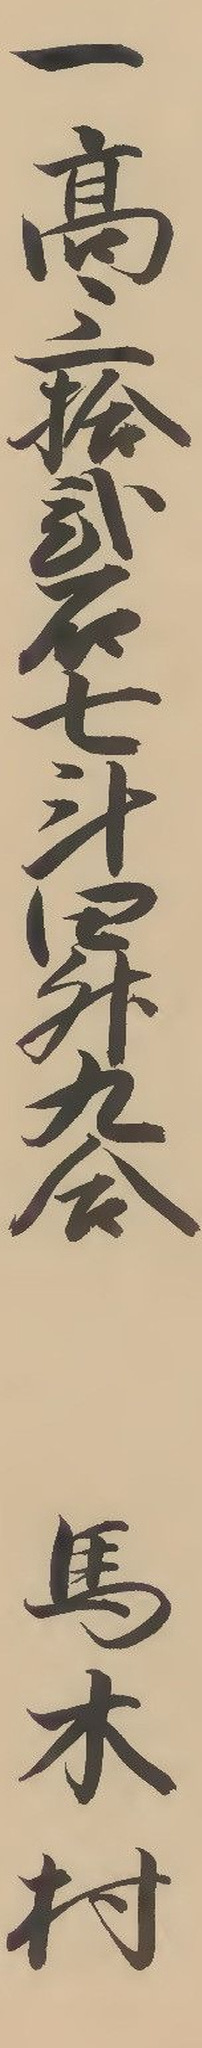一高三拾弐石七斗四升九合馬木村

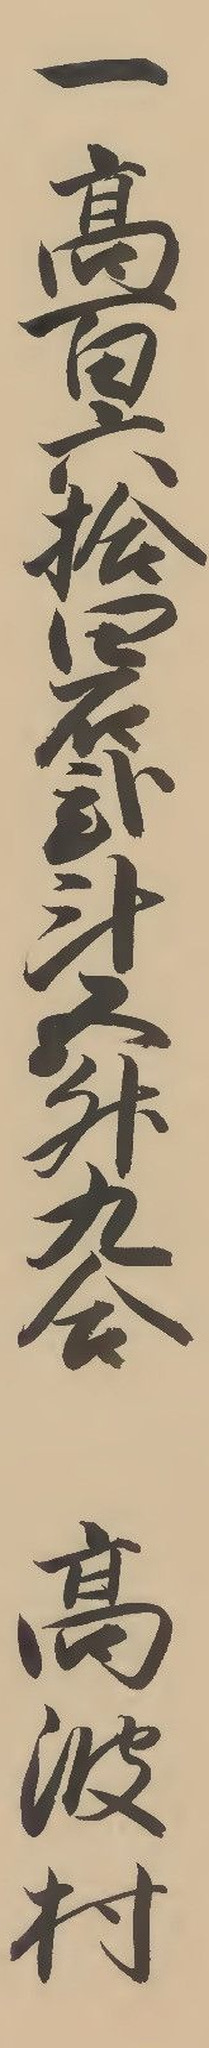一高百六拾四石弐斗五升九合高波村
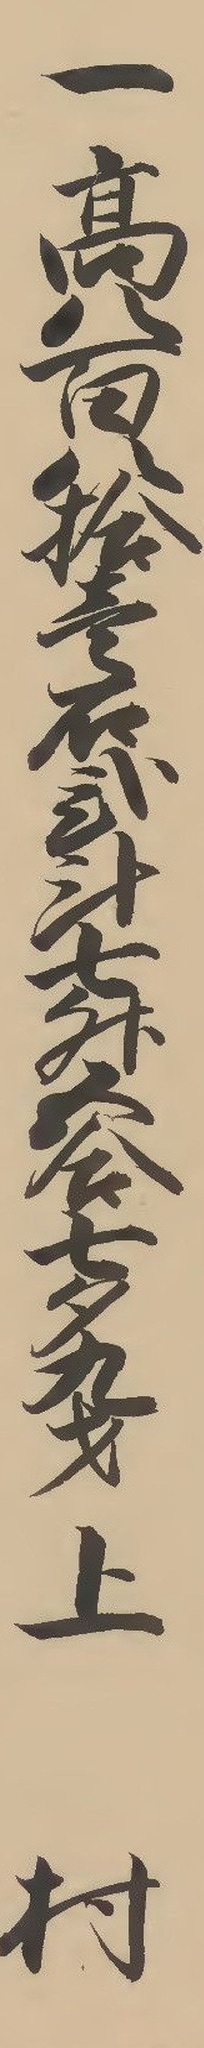一高八百八拾壱石弐斗七升五合七勺九才上村
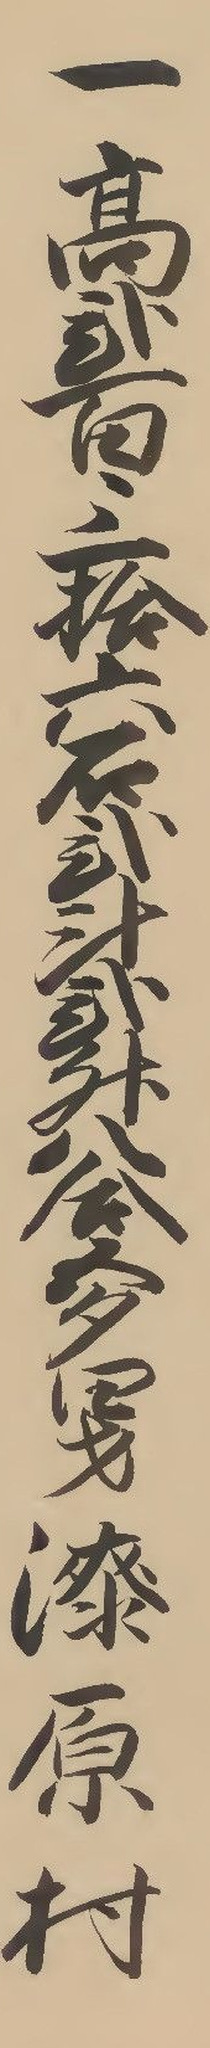一高弐百三拾六石弐斗弐升八合五勺四才漆原村
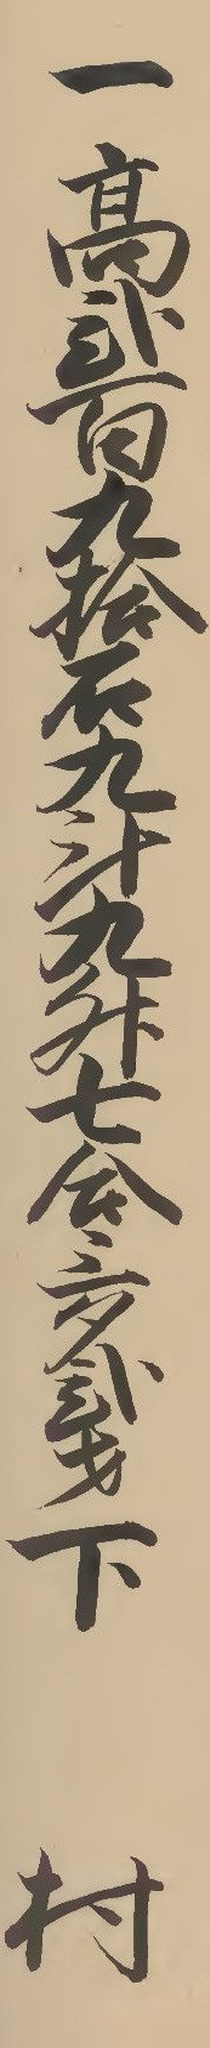一高弐百九拾石九斗九升七合三勺弐才下村
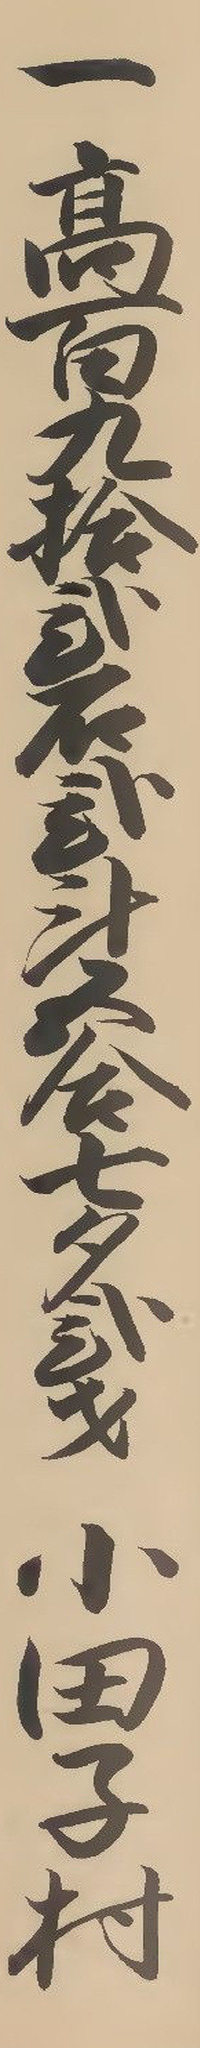一高百九拾弐石弐斗五合七勺弐才小田子村
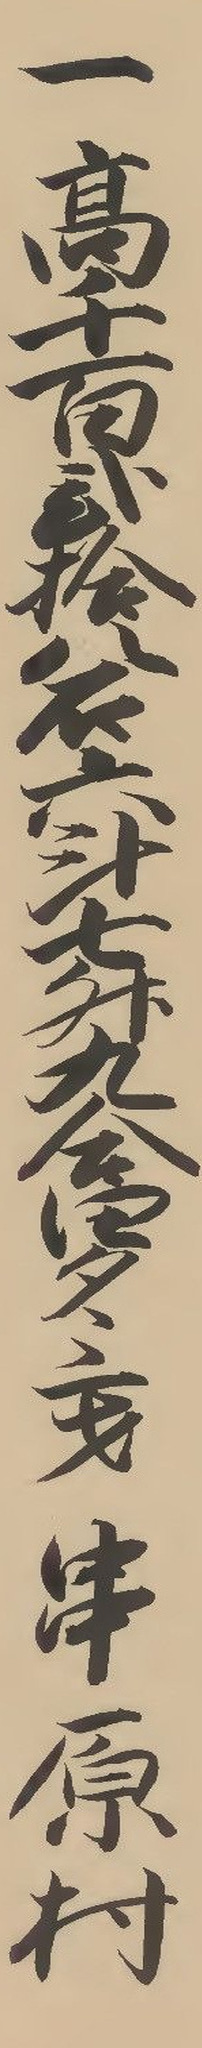一高千百弐拾八石六斗七升九合四勺三才串原村
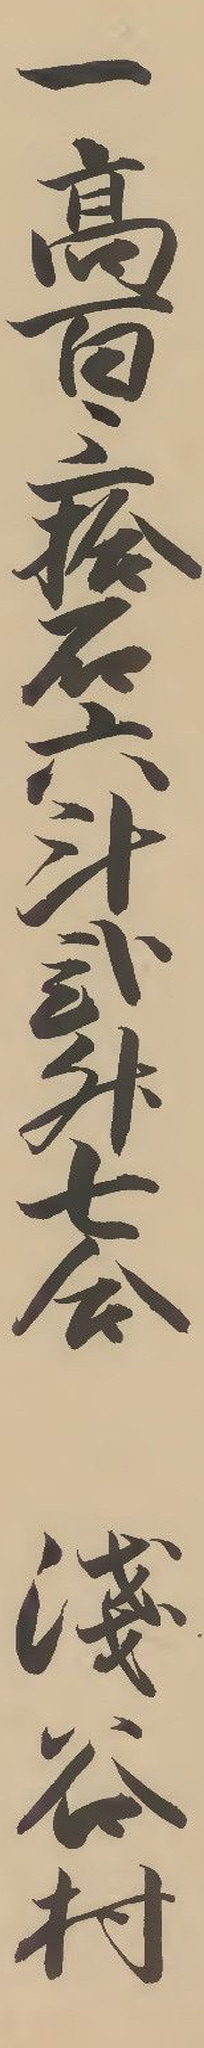一高百三拾石六斗弐升七合浅谷村

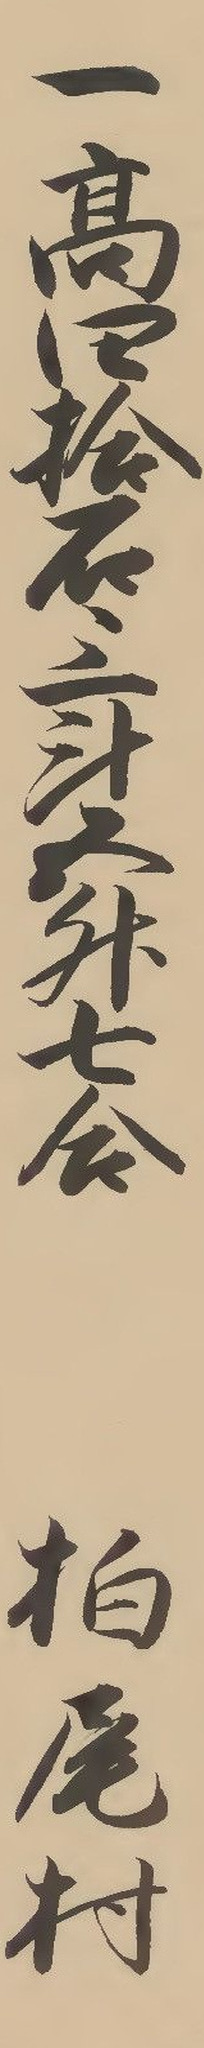一高四拾石三斗五升七合柏尾村
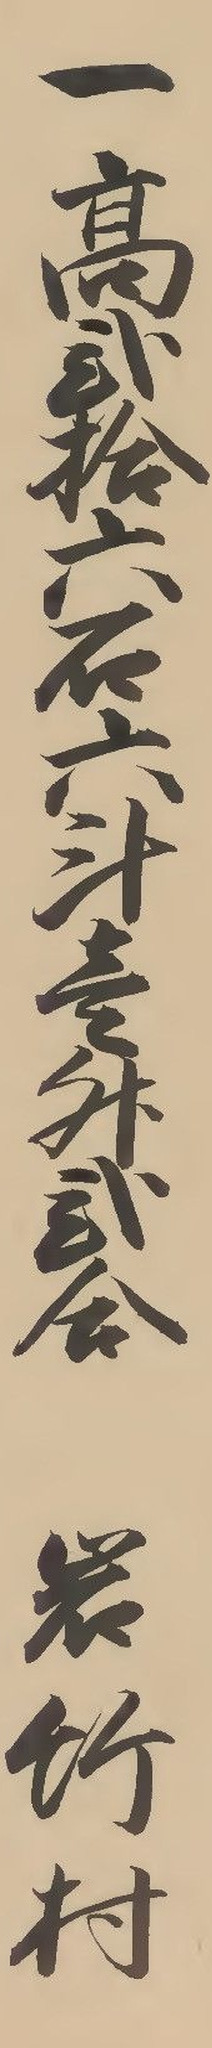一高弐拾六石六斗壱升弐合岩竹村
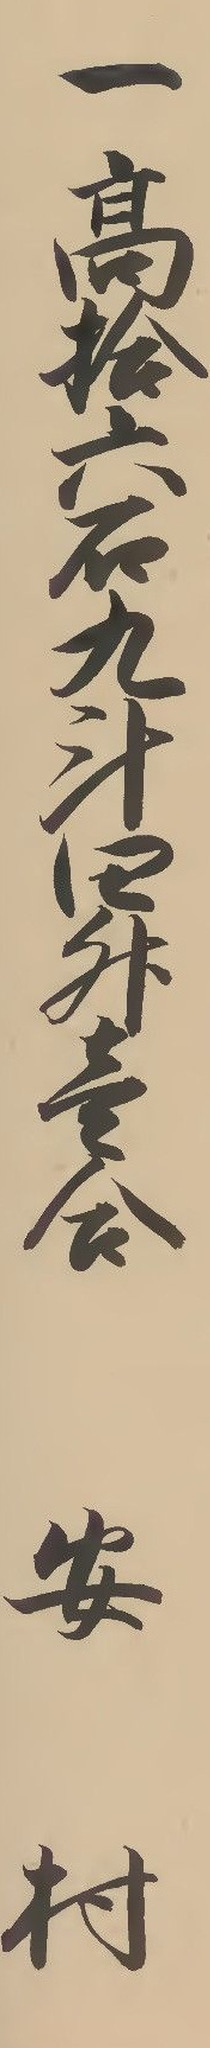一高拾六石九斗四升壱合安村
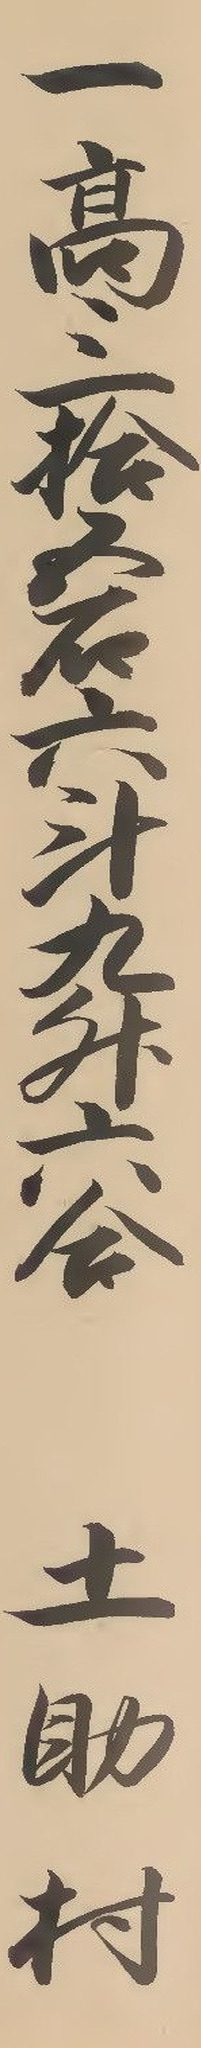一高三拾五石六斗九升六合土助村
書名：美濃国郷帳
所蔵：国立公文書館 National Archives of Japan
